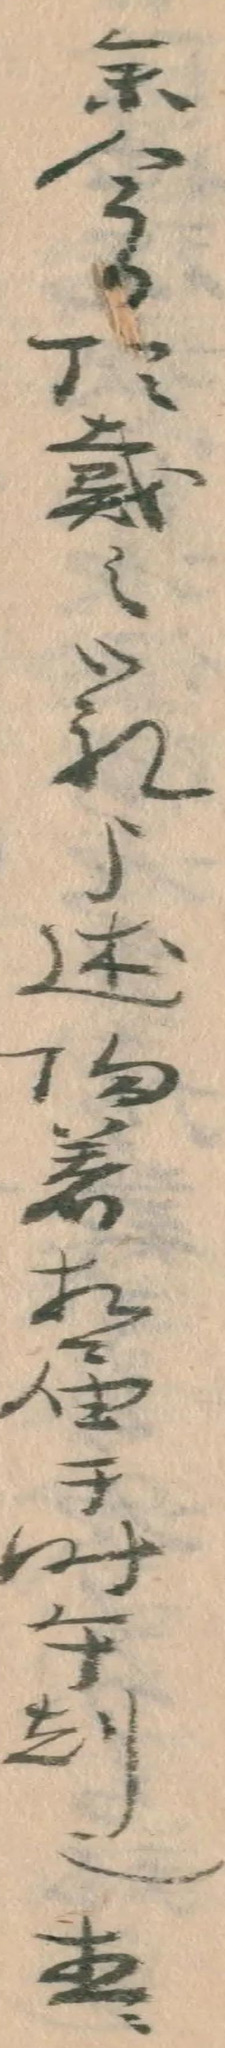参今日頂戴也御礼申述帰着相届于時午刻也直ニ
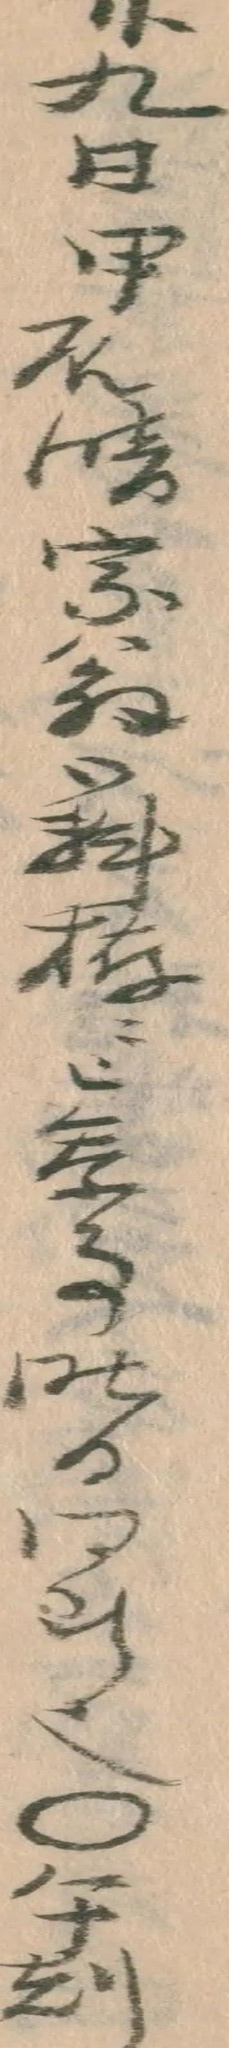廿九日甲辰晴家翁御料拵ニ而参事昨日同断也○午刻
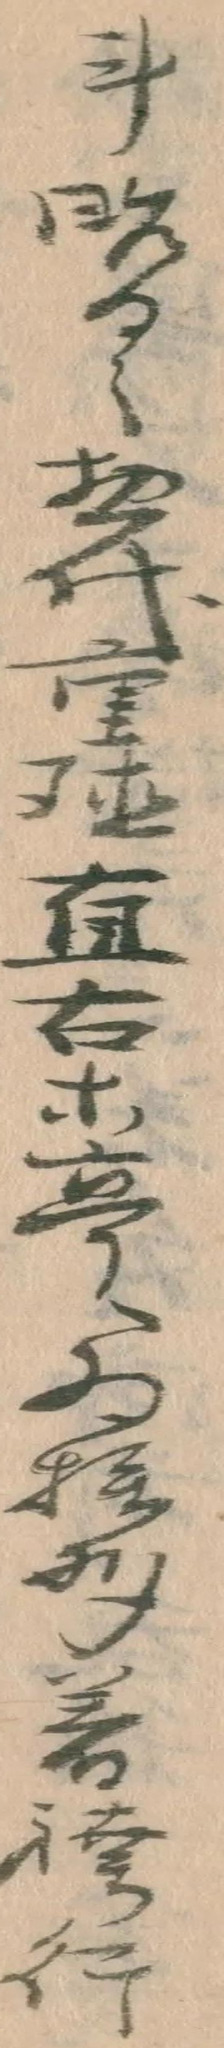斗昨日之惣代重殖直右等亭へ為挨拶着袴行
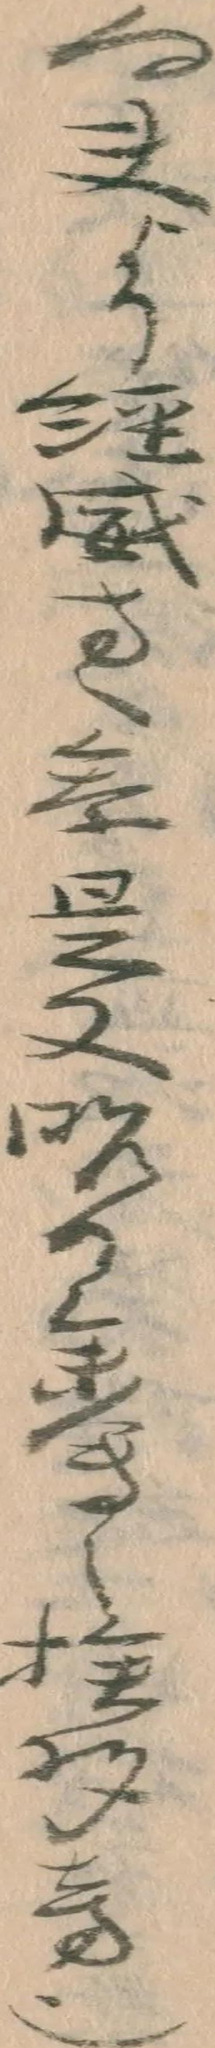向夫より経威方へ参是又昨日参會之挨拶旁也
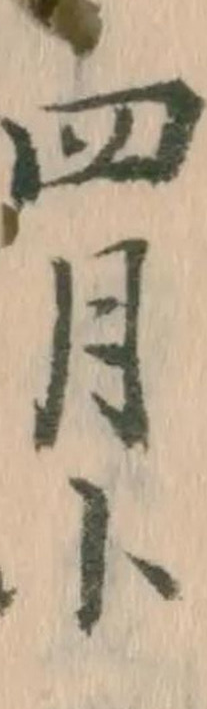四月小
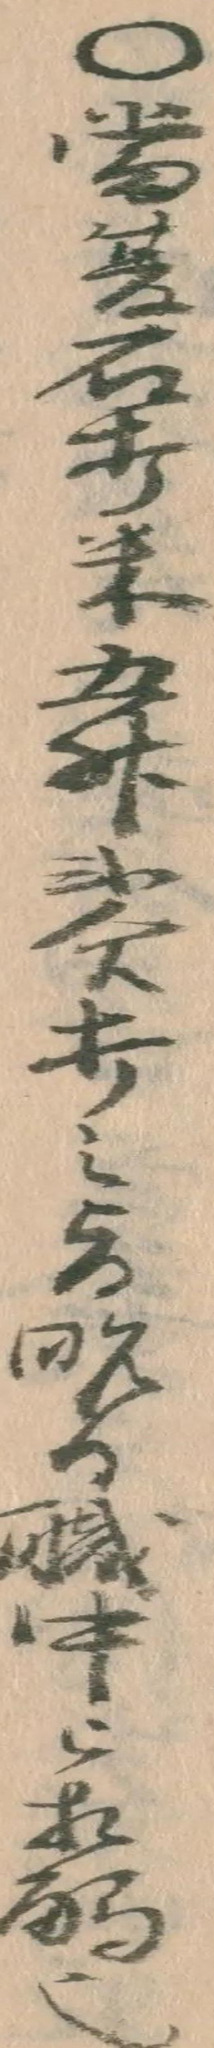○當夏石打米五升弐合打之旨晩日職中被相触也
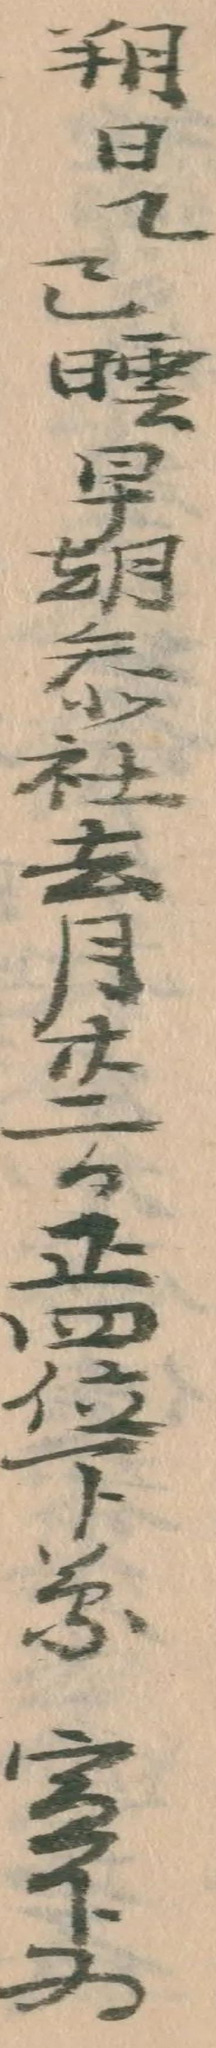朔日乙巳曇早朝参社去月廿二日正四位下蒙宣下為
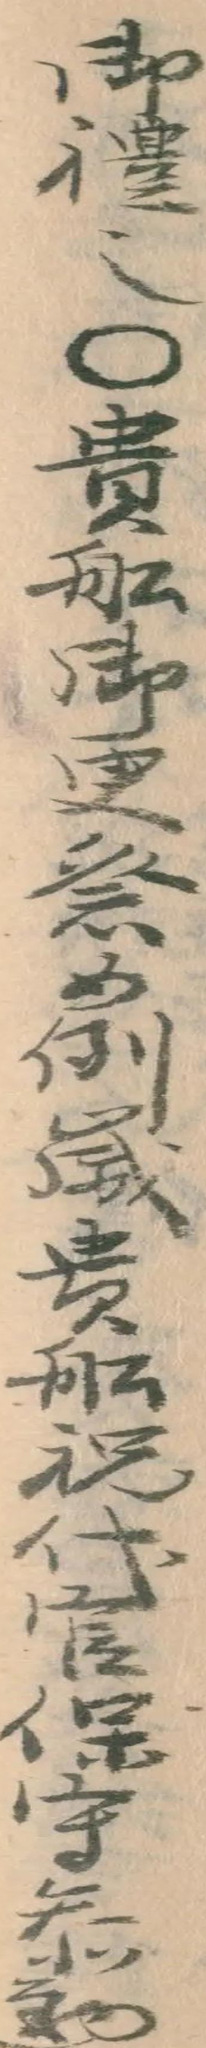御禮也○貴舩御更祭如例歳貴舩祝代官保守参勤
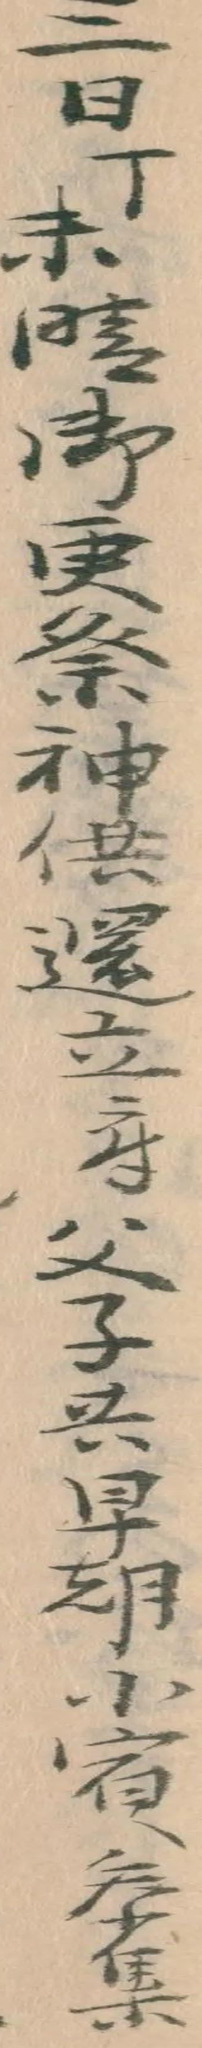三日丁未晴御更祭神供還立ニ付父子共早朝小宿へ参集
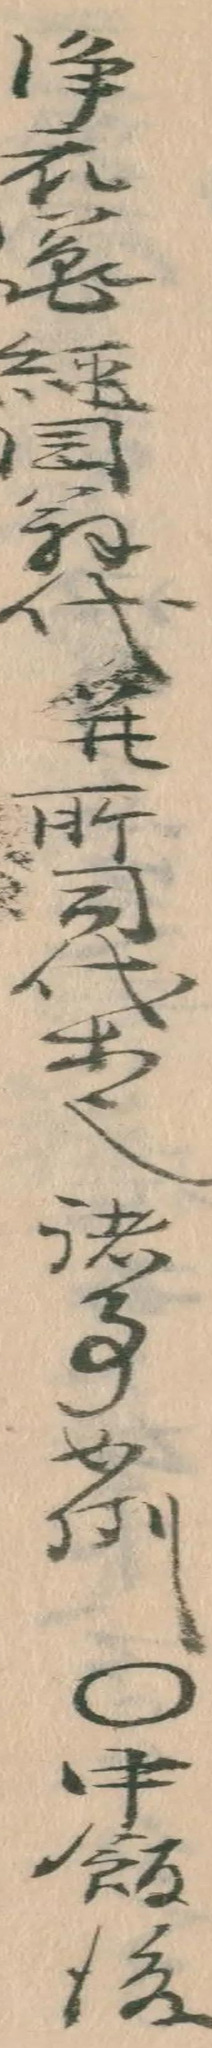浄衣鬮経国翁代幷所司代等也諸事如例〇中飯後
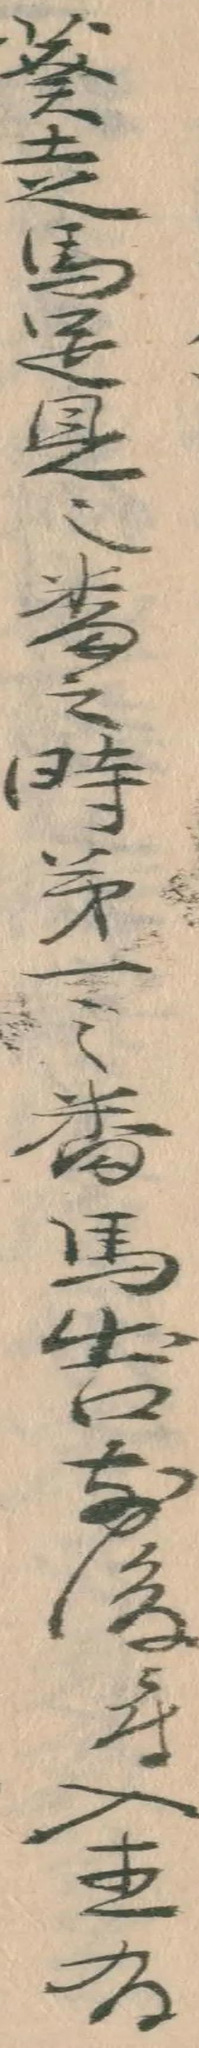葵走馬足見也番之時第一之番馬出口前後ニ付入直有
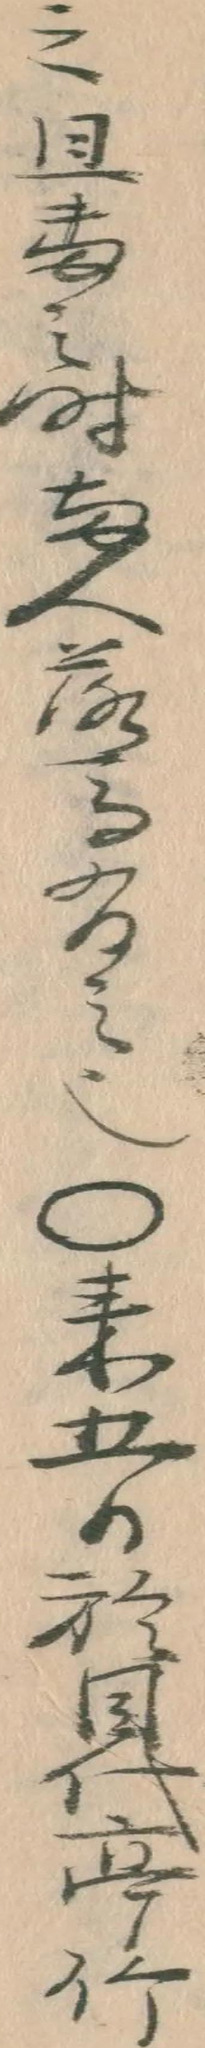之且番之時両人落馬有之也〇来五日於目代亭竹
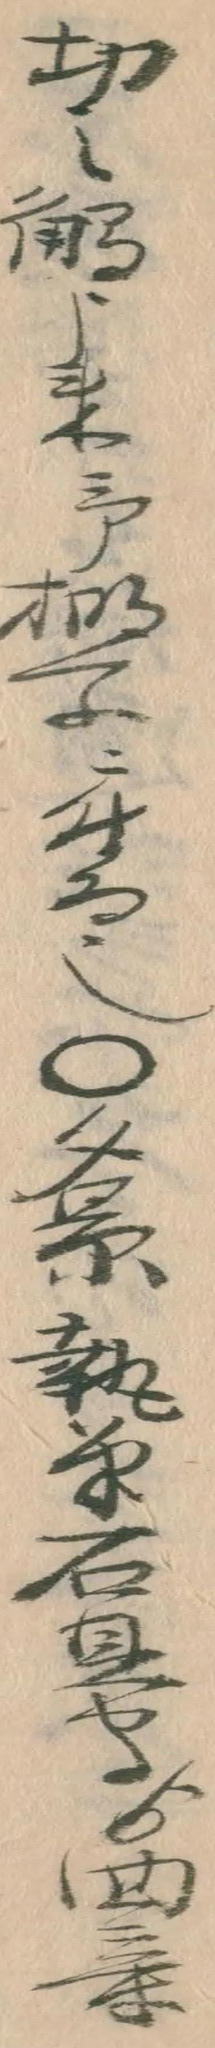切之触申来ニ而棚所ニ付而也○夕景執筆石見守ゟ回意
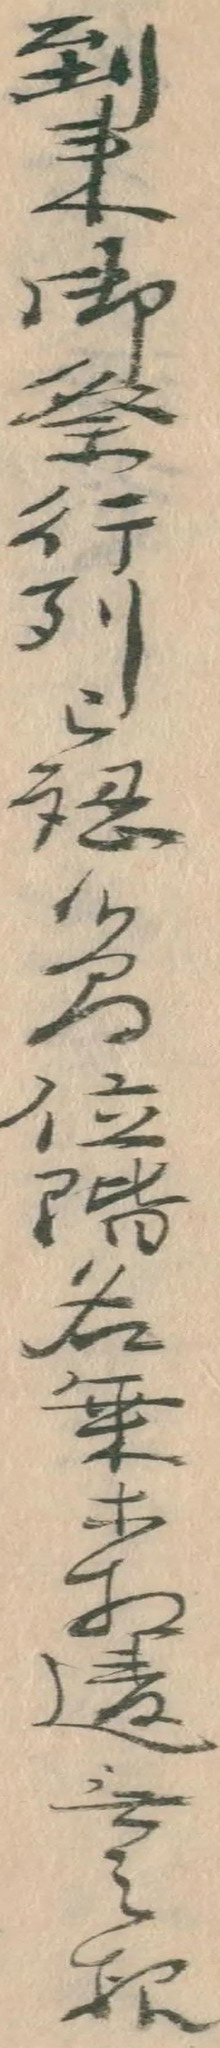到来御祭行列被認候間位階名乗等相違無之様
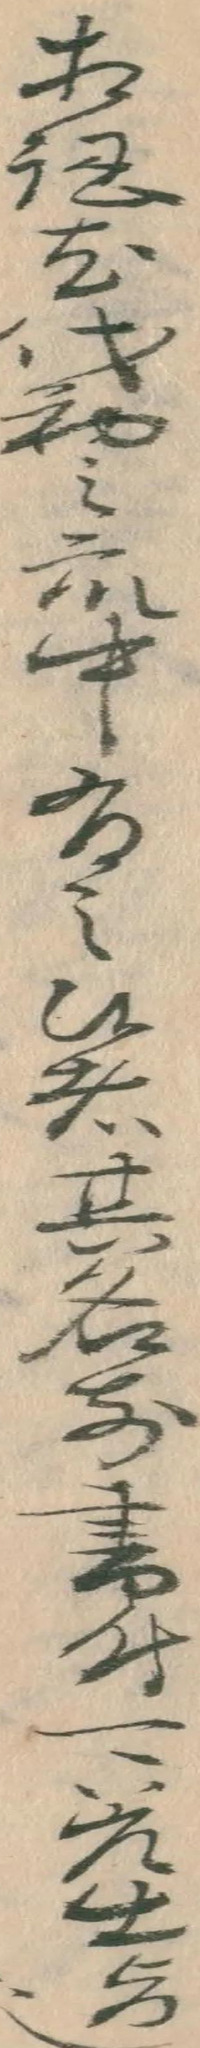相認尤代勤之衆中有之候者其名前書付可差出旨也
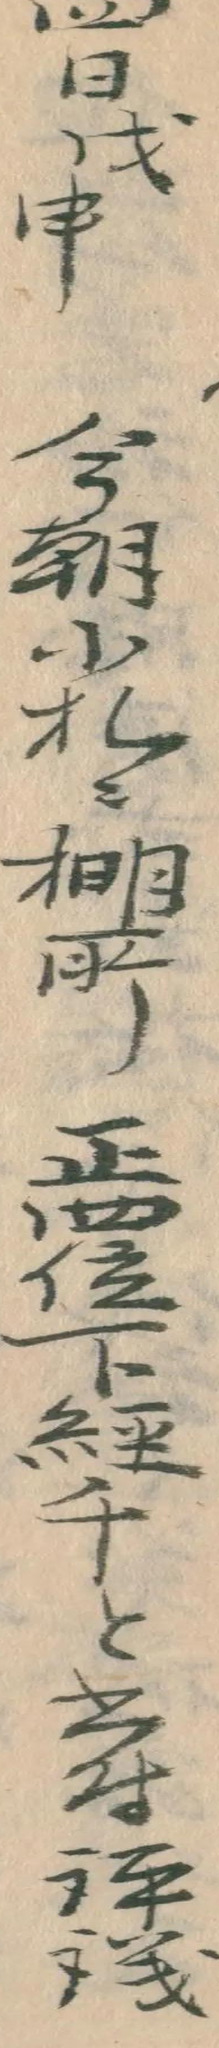四日戊申今朝小札ニ棚所正四位下經千と書付評議
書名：賀茂社記録. 第63冊
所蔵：国立国会図書館 National Diet Library, JAPAN
